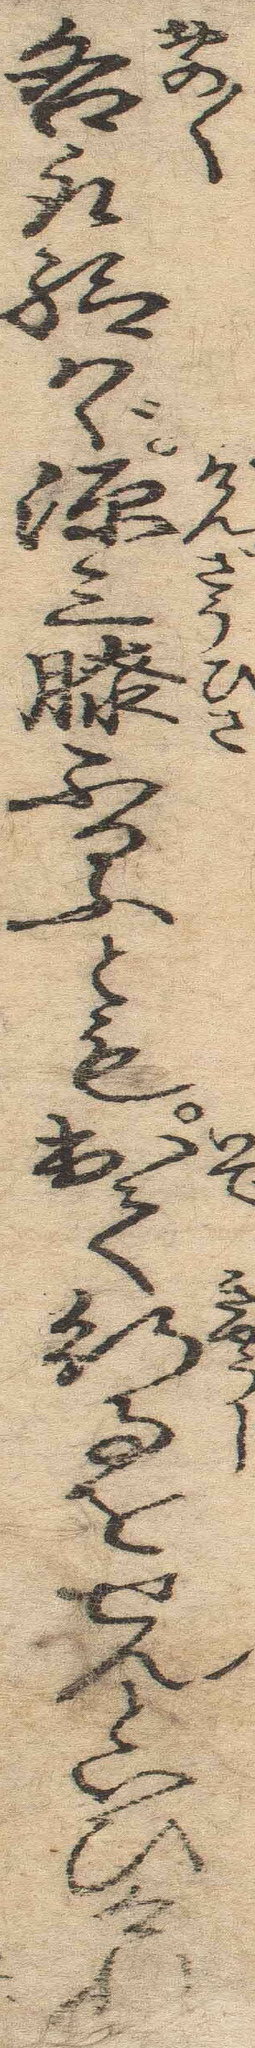各取給はゞ。源三膝ふるふとも。出て行事をせんといひけれ
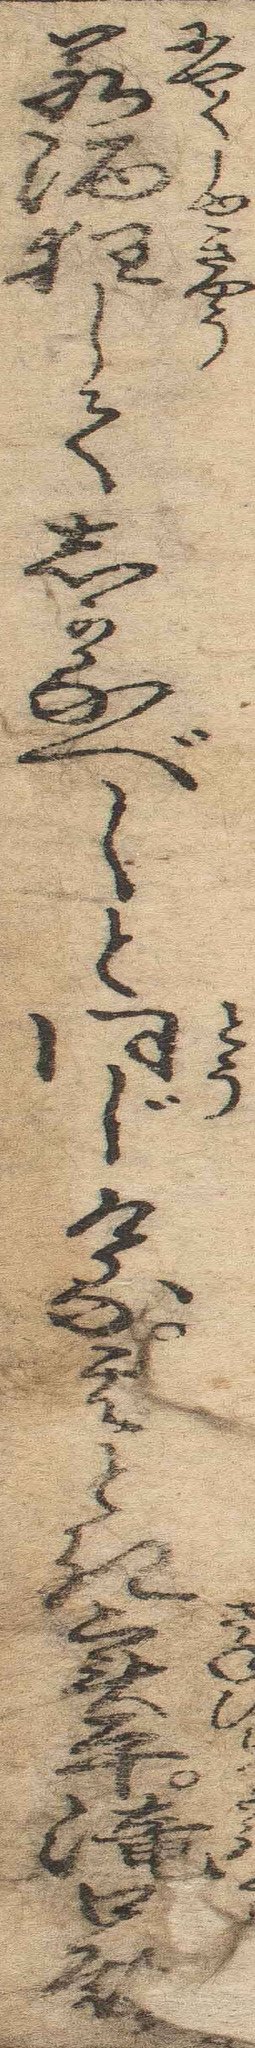若酒狂してしかるべしと同じける。其とき實平。滝口殿

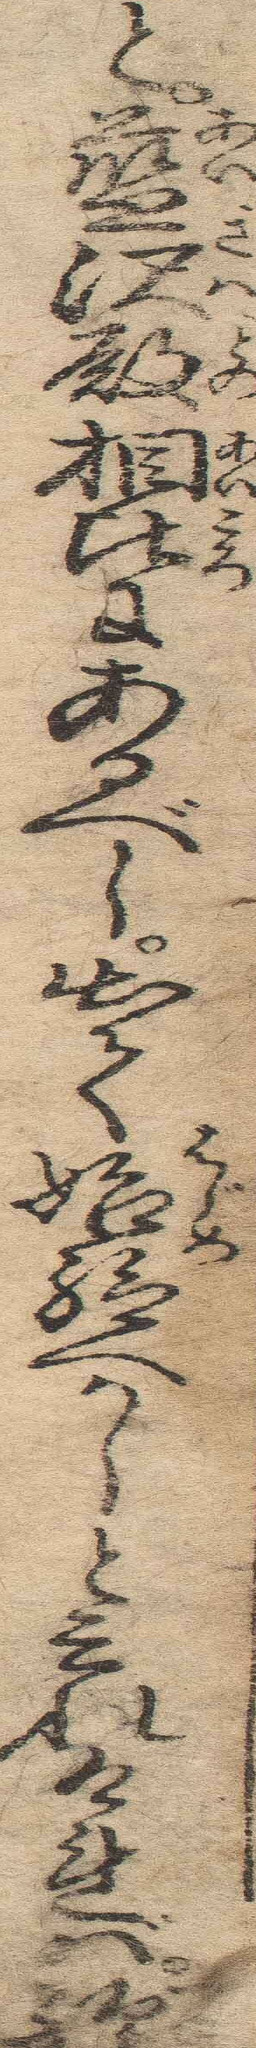と。藍沢殿相比にあるべし。出て始給へかしと云れければ。経
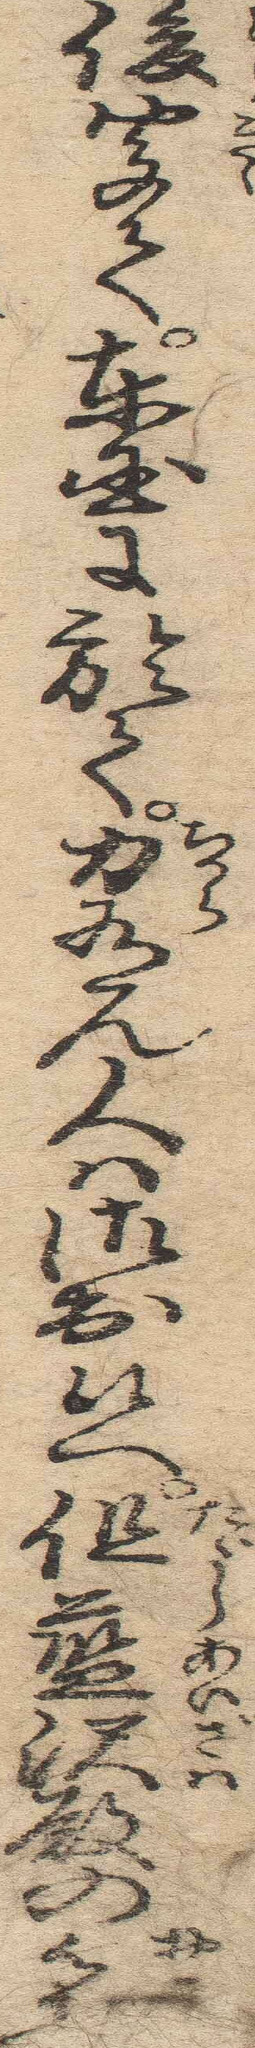俊聞て。東国に於て。力有ん人は御出候へ。但藍沢殿の御
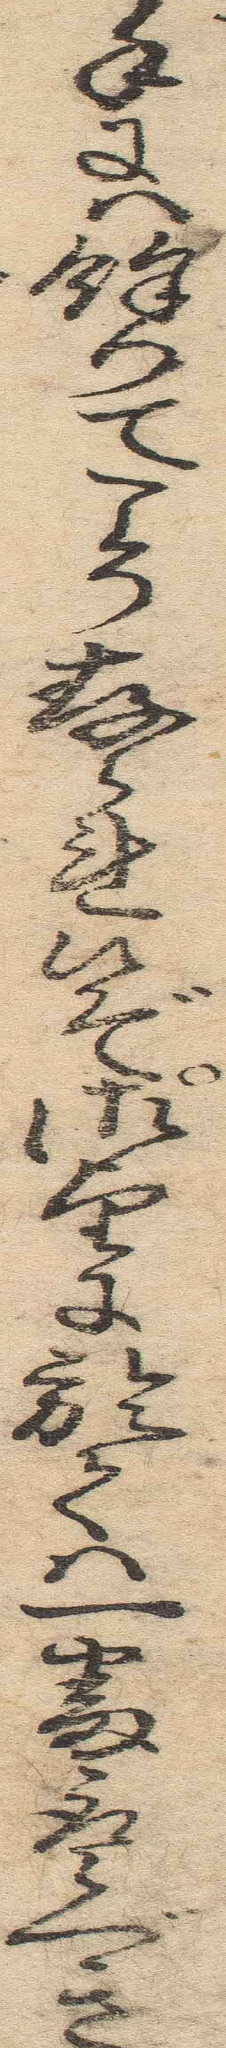手には餘りてこそ存られ候ぞ。御望に於ては一番取候べき
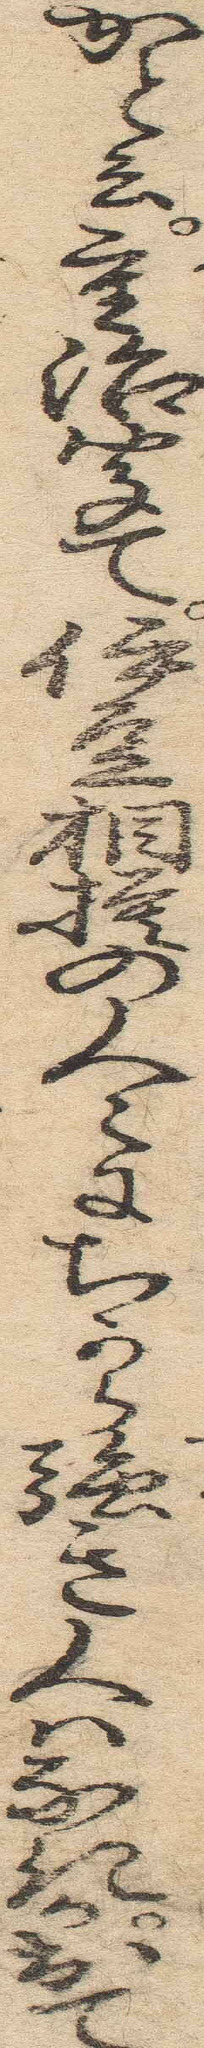かと云。重治聞て。伊豆相模の人々にちから強き人はなきか。出て
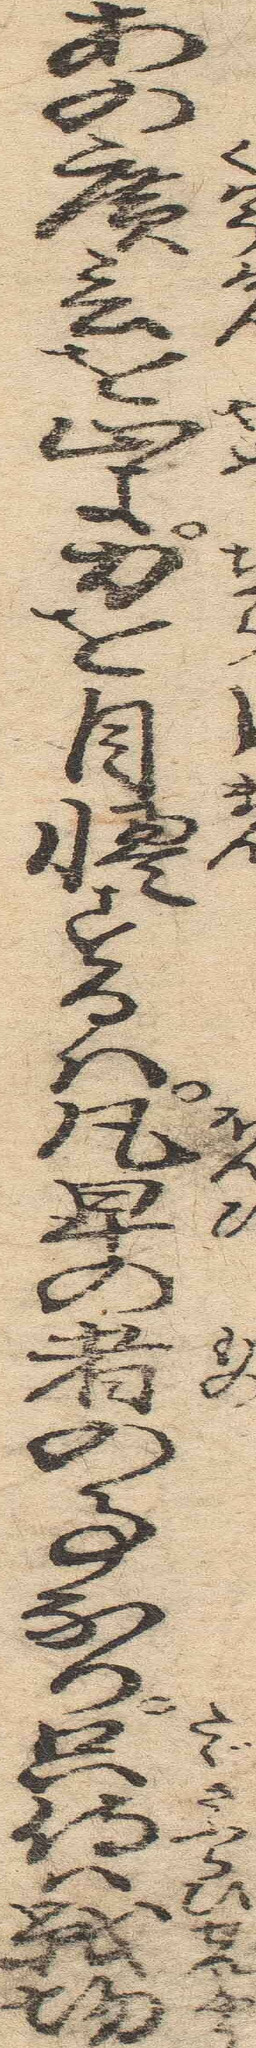あの広言を止よ。力を自慢するは。凡卑の者の事なり。只侍は戦場
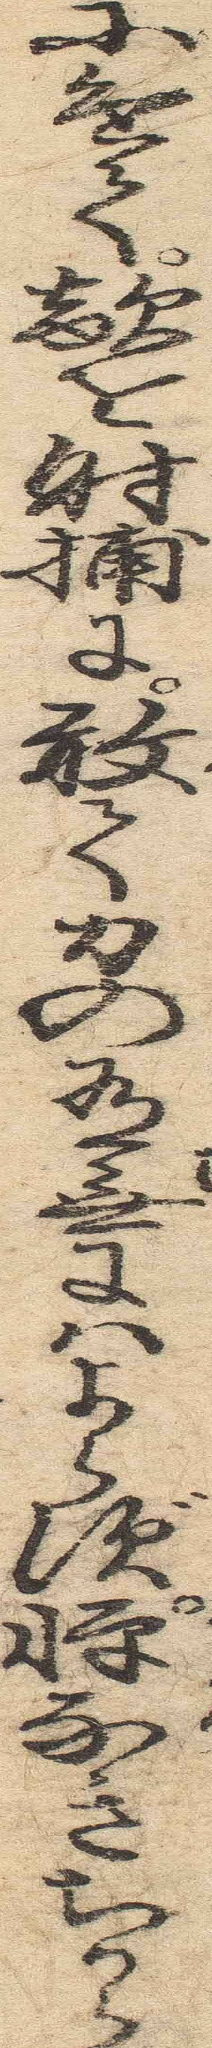に進て。敵を射捕に。敢て力の有無にはよらず。憚なきちから
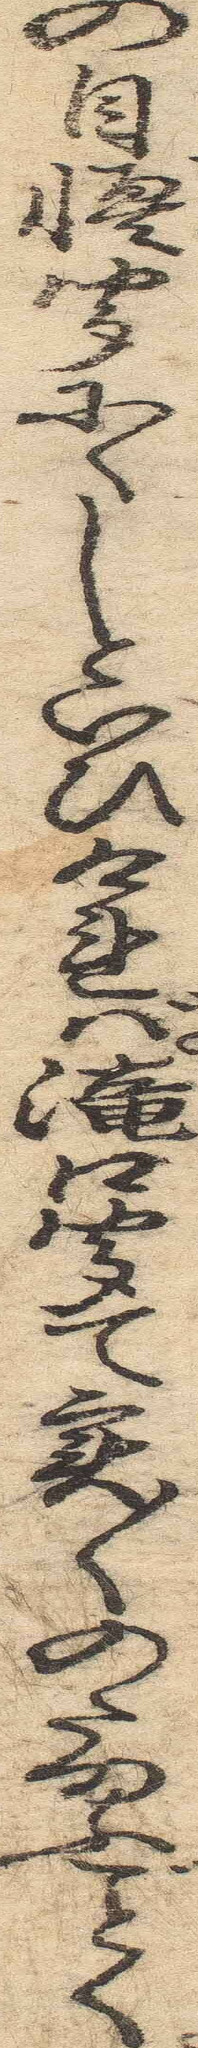の自慢聞にくしといひければ。滝口聞て実〳〵のたまふごとく。
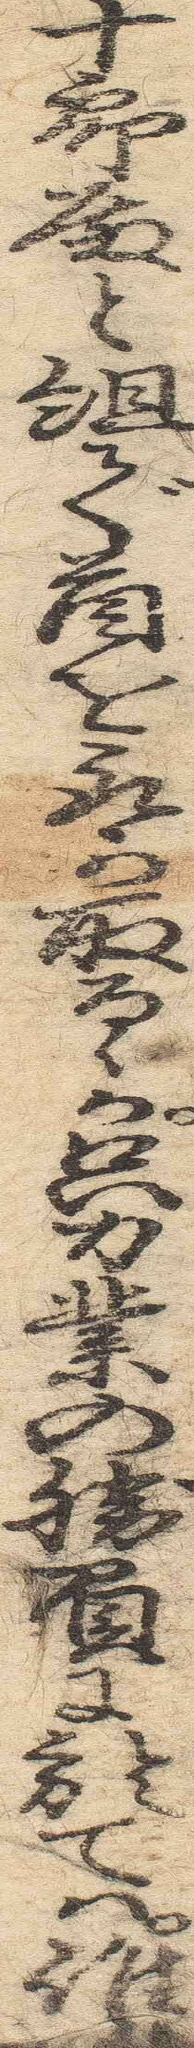十郎殿と組で首を取か取るゝか。只力業の勝負に於ては。誰
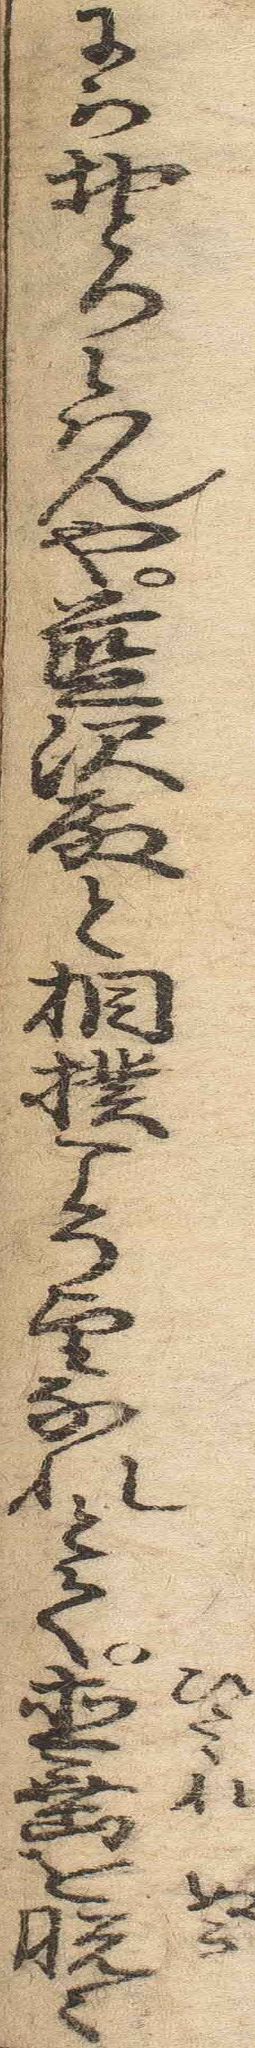にかおとり候はんや。藍沢殿と相撲こそ望なれとて。直垂を脱て
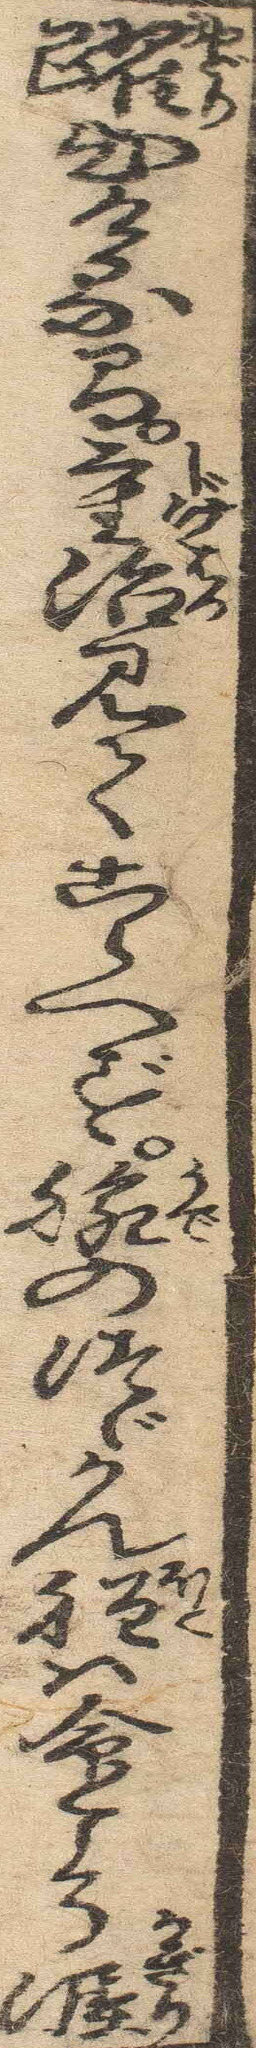躍出ける間。重治見てこらへず。腕のつゞかん程は命こそ涯
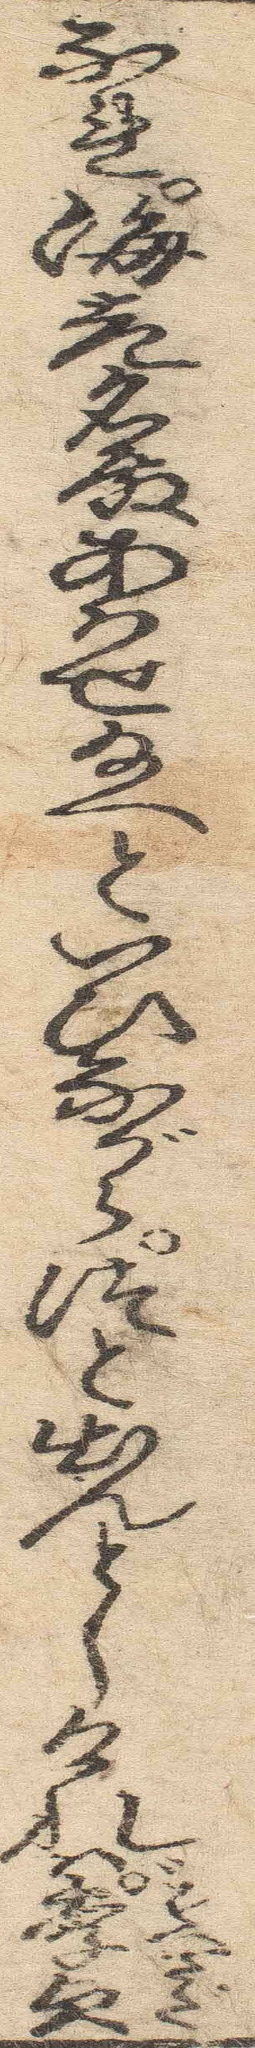なれ。海老名殿あはせ給へといひながら。つと出んとしければ。季貞
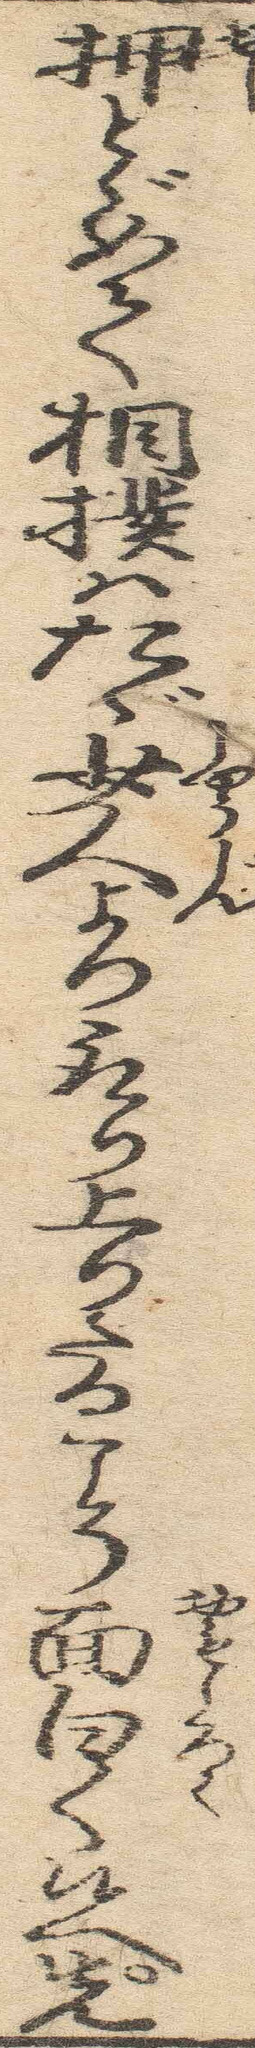押とゞめて相撲はたゞ少人より取り上りたるこそ面白く候へ。先
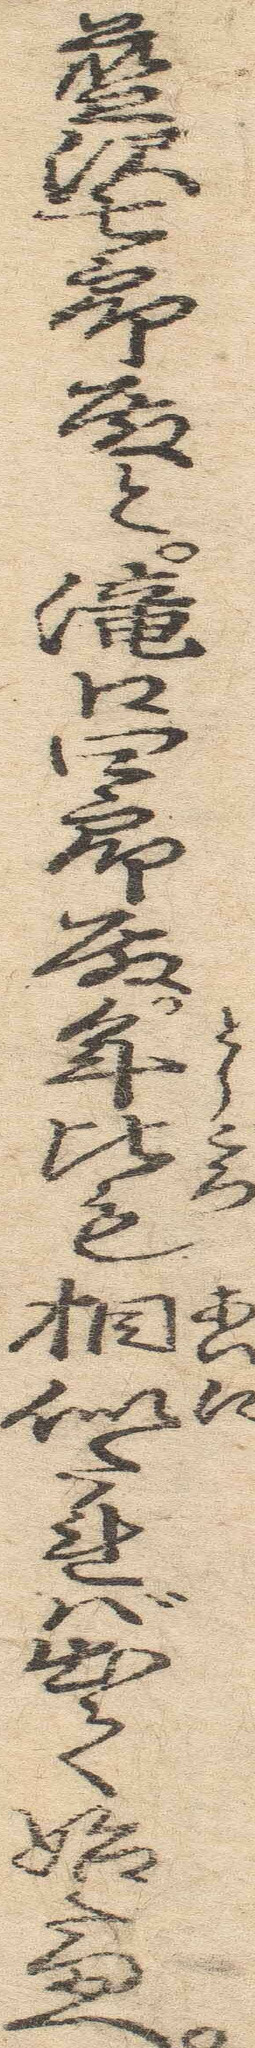藍沢七郎殿と。滝口四郎殿。年比も相似たれば出て始たまへ。
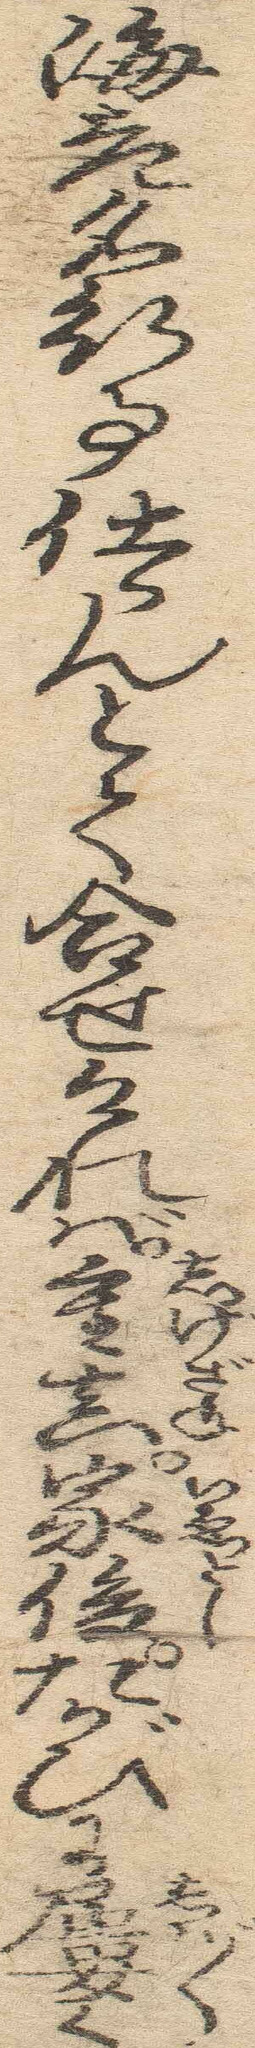海老名行事仕らんとて合せければ。重真。家俊。たがひに屡々
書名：古今相撲大全
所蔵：東京学芸大学附属図書館 国文学研究資料館
